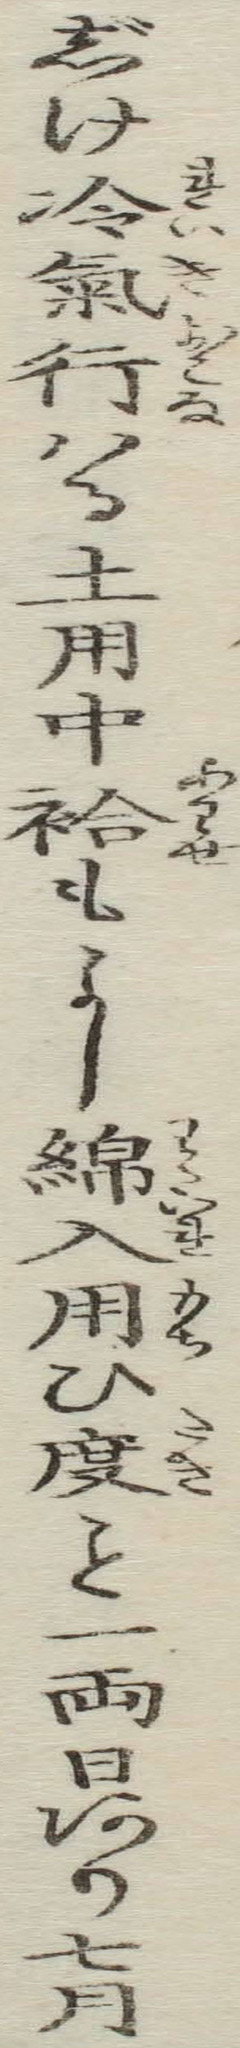じけ冷気行はる土用中袷もよし綿入用ひ度こと一両日あり七月
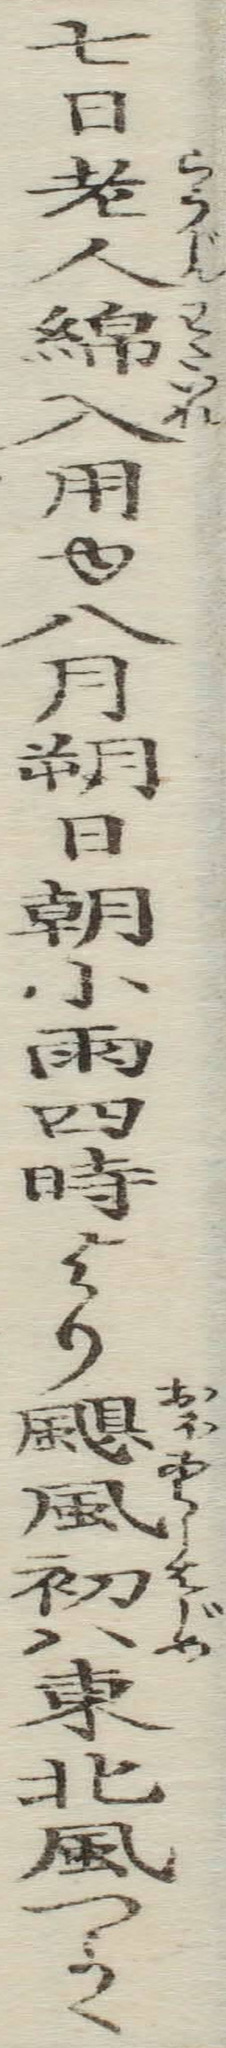七日老人綿入用ゆ八月朔日朝小雨四時より颶風初は東北風つよく
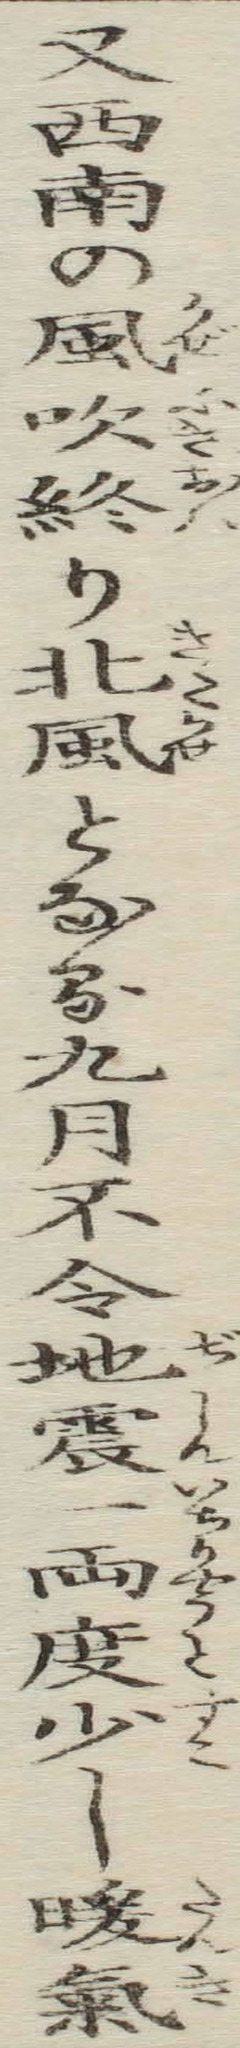又西南の風吹終り北風となる九月不令地震一両度少し暖気
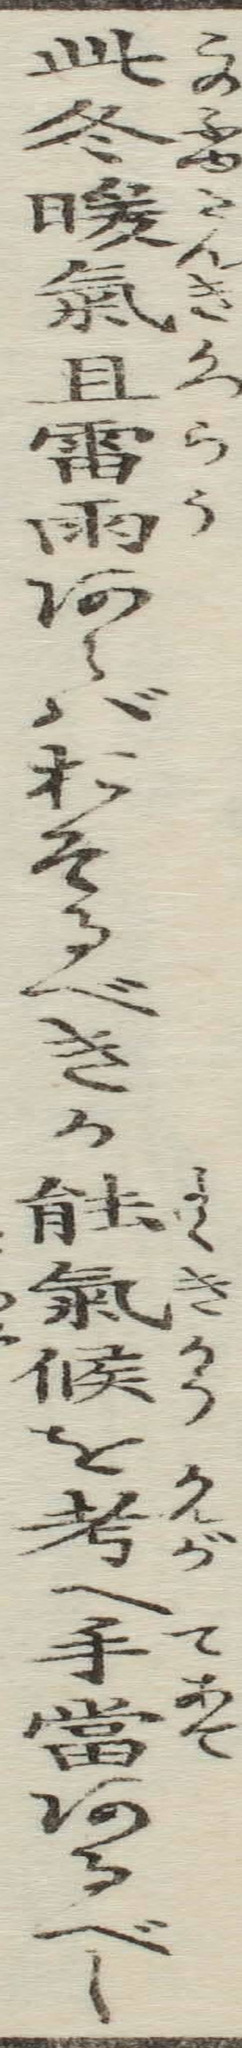此冬暖気且雷雨あらばおそるべきか能気候を考へ手当あるべし
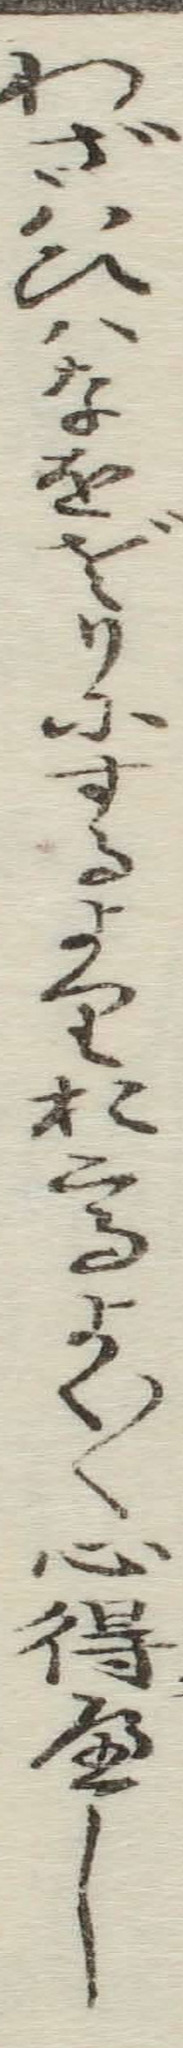わざはひはなをざりにするよりおこるよく〳〵心得へし
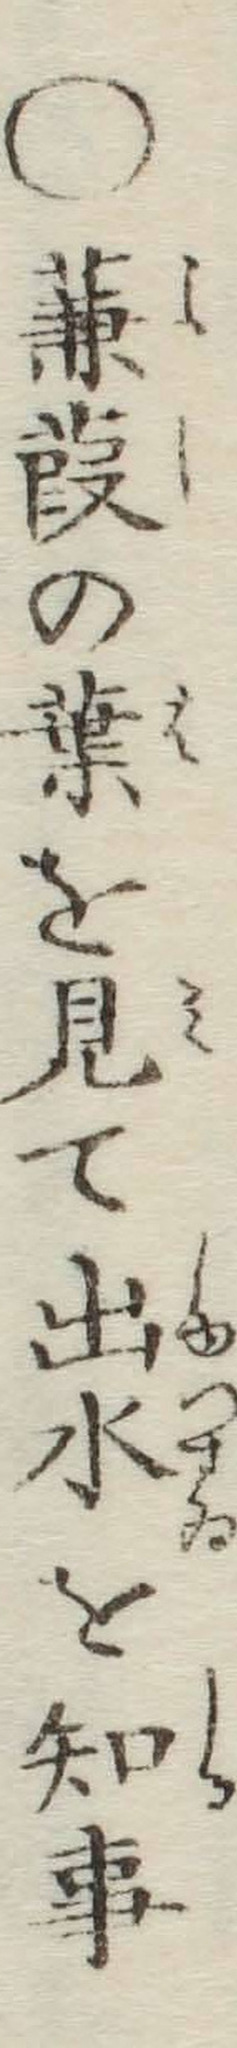○蒹葭の葉を見て出水を知事
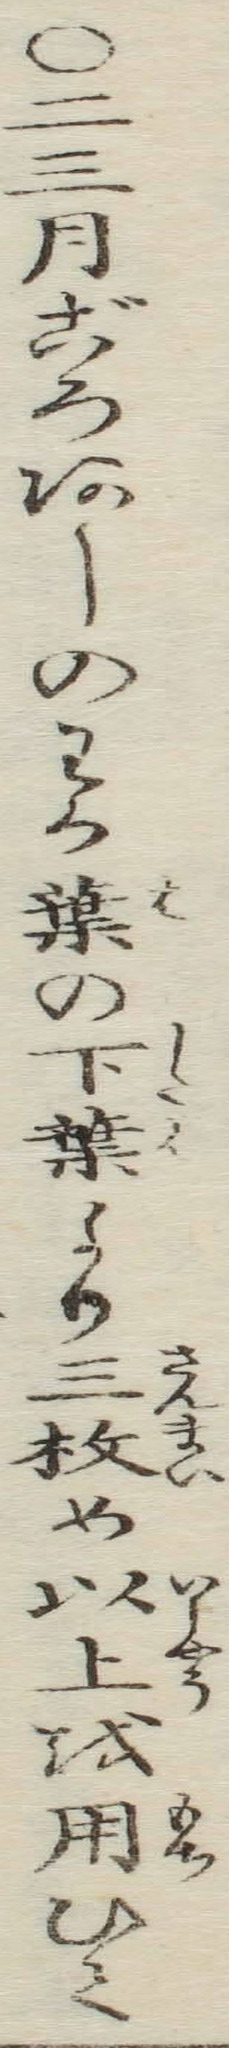○二三月ごろあしのわか葉の下葉より三枚め以上を用ひて
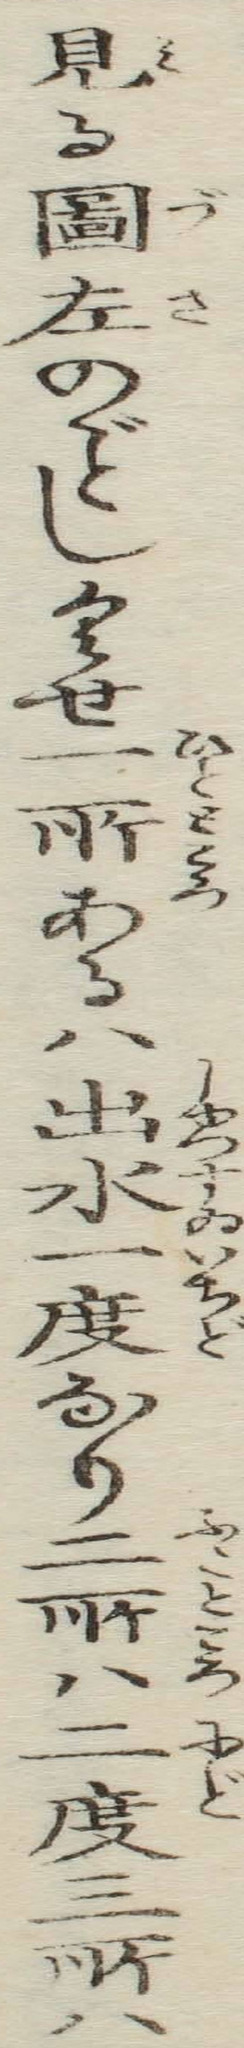見る図左のごとしくせ一所あるは出水一度なり二所は二度三所は
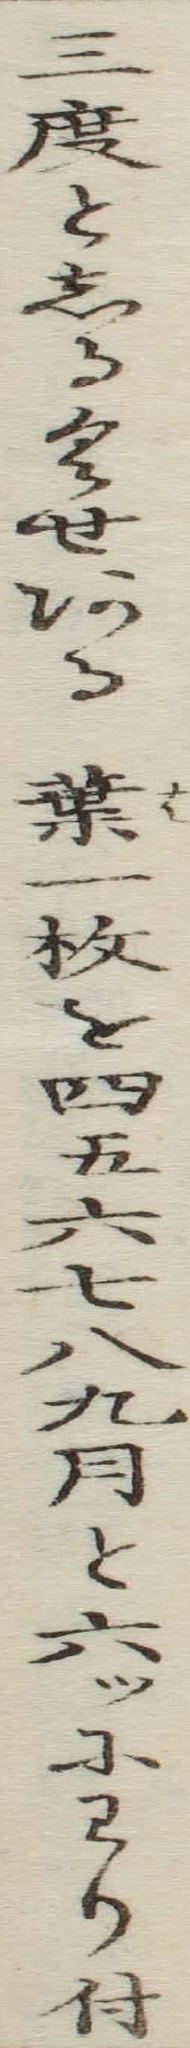三度としるくせある葉一枚を四五六七八九月と六ッにわり付

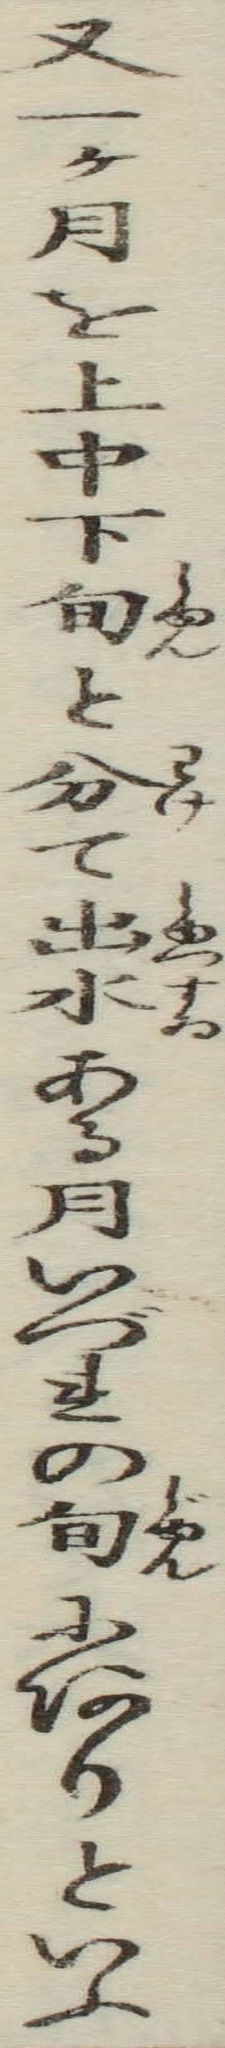又一ヶ月を上中下旬と分て出水ある月いづれの旬にありといふ
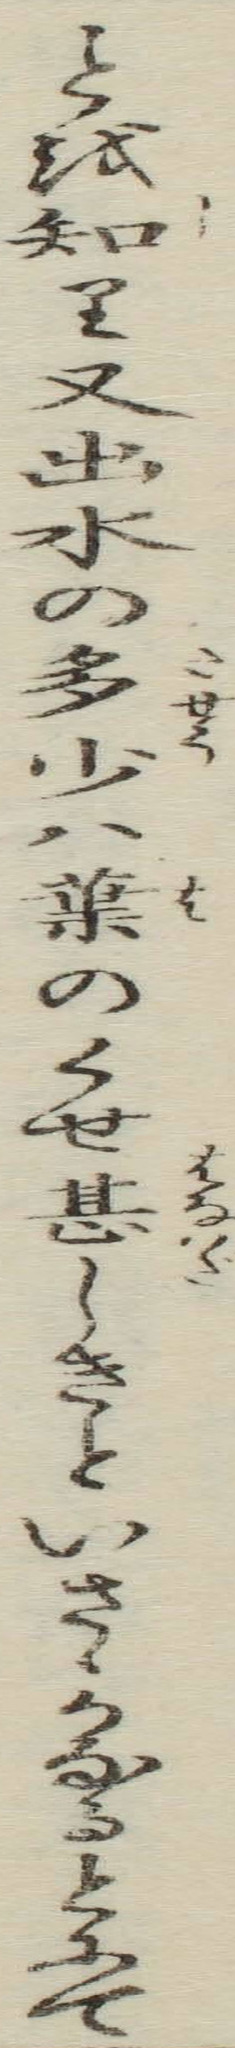ことを知り又出水の多少は葉のくせ甚しきといさゝかなるとにて
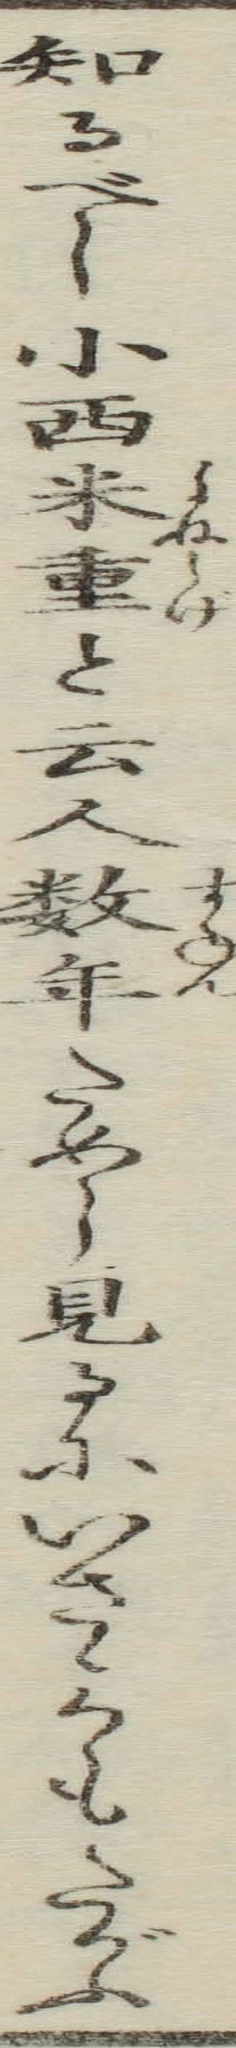知るべし小西米重と云人数年ためし見るにいさゝかもたがふ
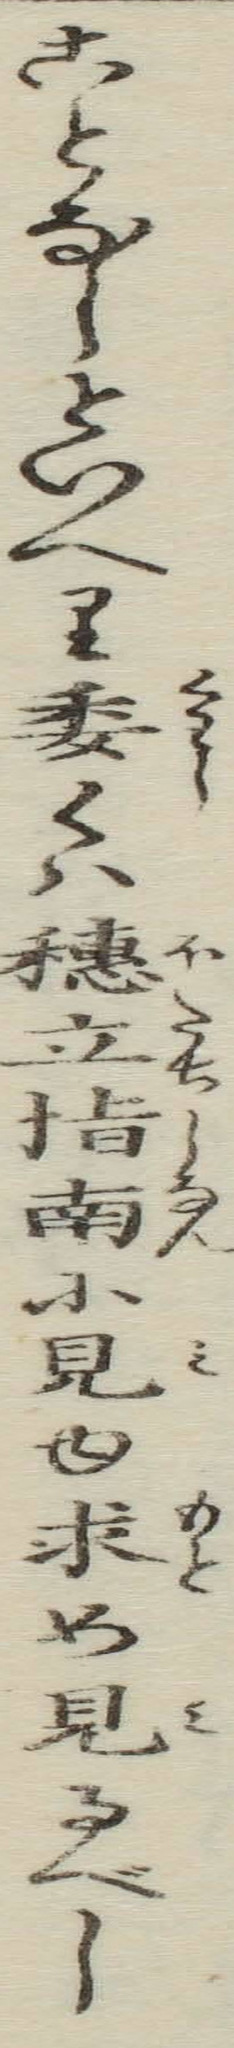ことなしといへり委くは穂立指南に見ゆ求め見るべし
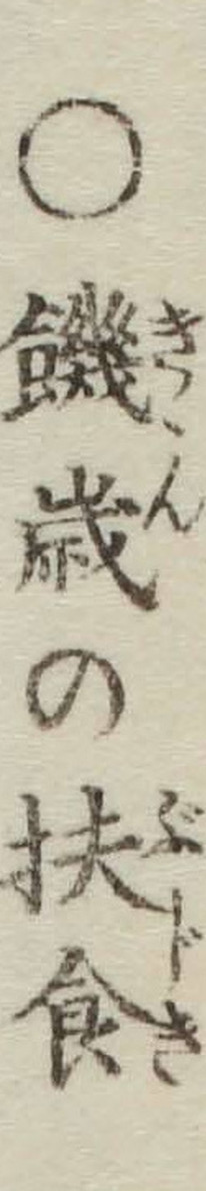○饑歳の扶食
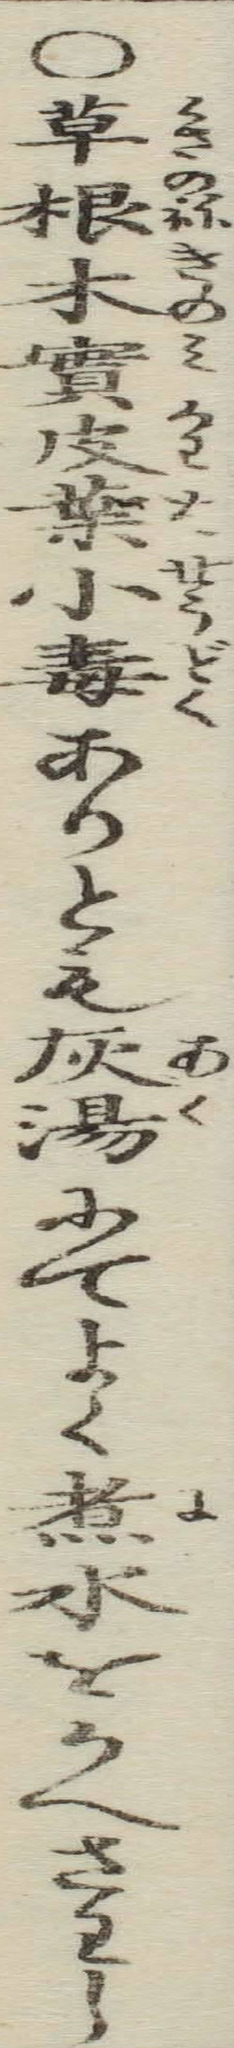○草根木實皮葉小毒ありとも灰湯にてよく煮水をかへさわし
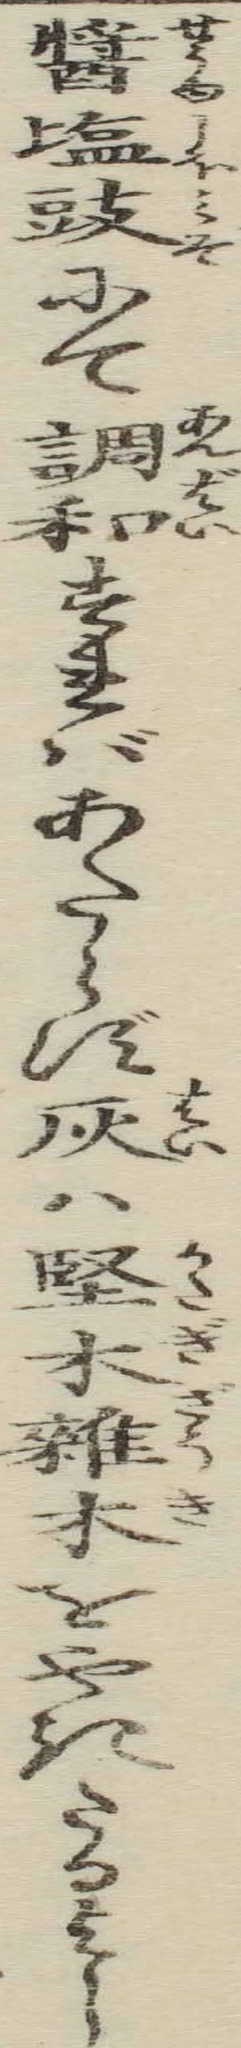醤塩豉にて調和すればあたらず灰は堅木雑木をやきたるよし
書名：救荒便覧
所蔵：国文学研究資料館
